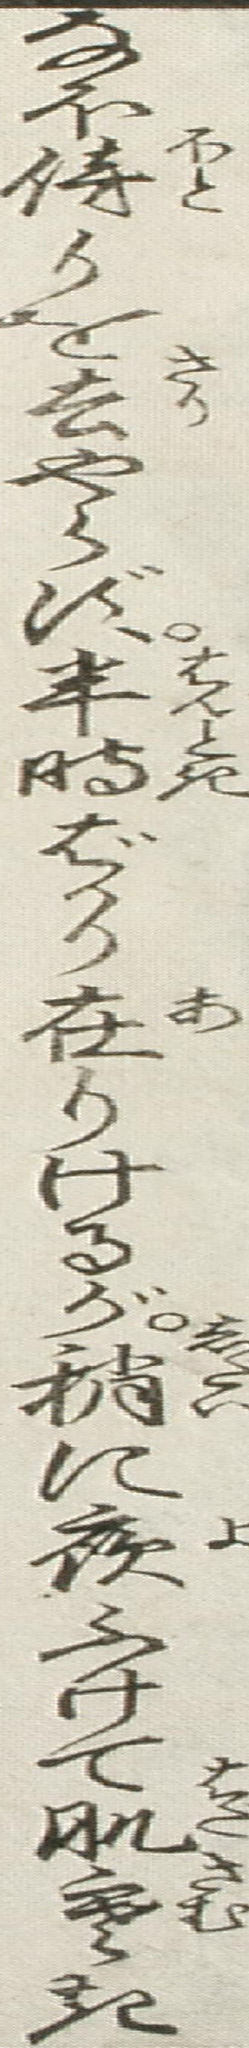なほ傍りを去やらず。半時ばかり在りけるが。稍に夜ふけて肌寒き
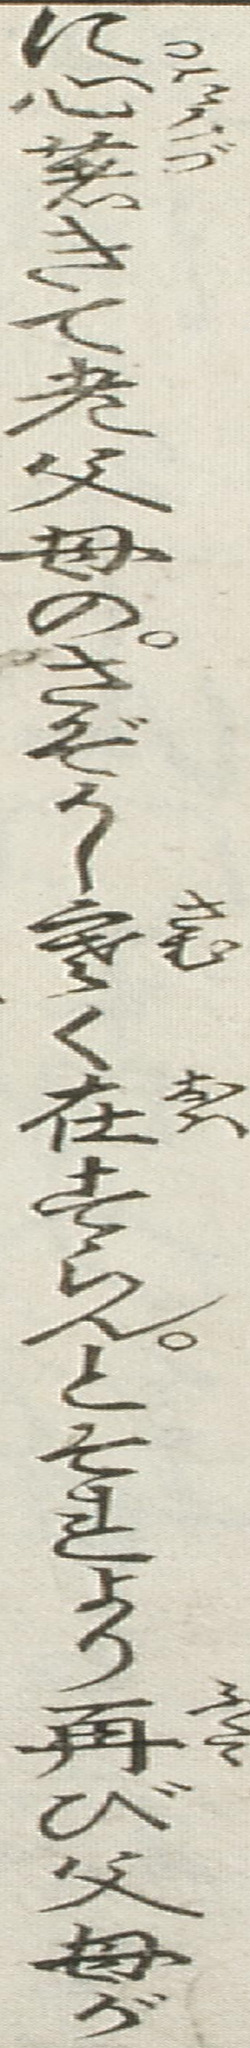に。心著きて老父母の。さぞかし寒く在すらん。とそれより再び父母が
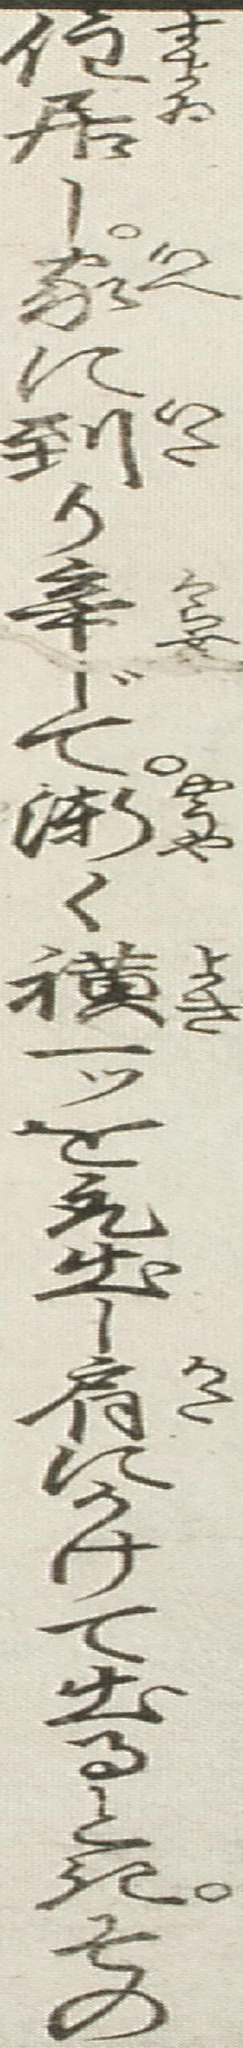住居し。家に到り辛じて。漸く横一ッを取出し肩にかけて出るとき。その
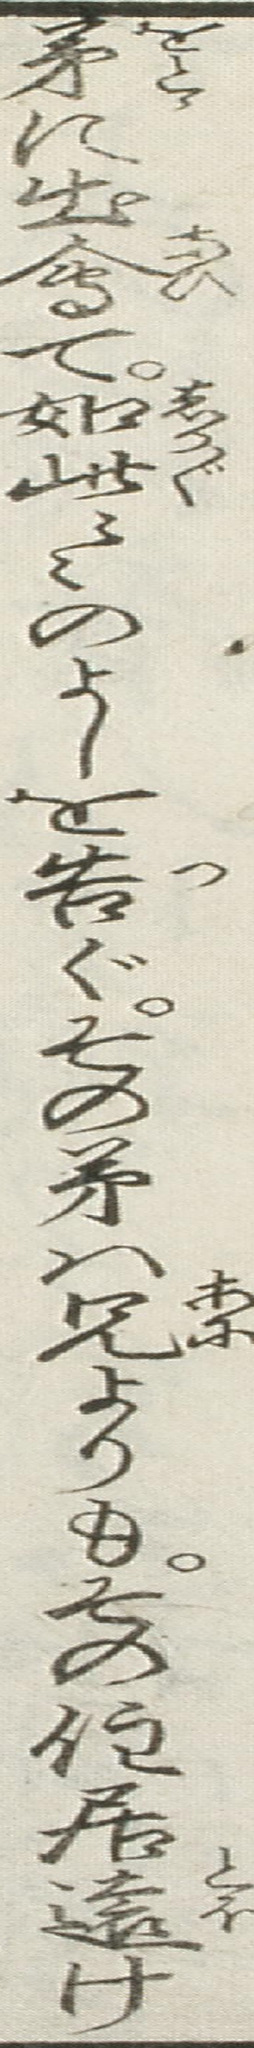弟に出会て。如此〻〻のよしを告ぐ。その弟は兄よりも。その住居遠け
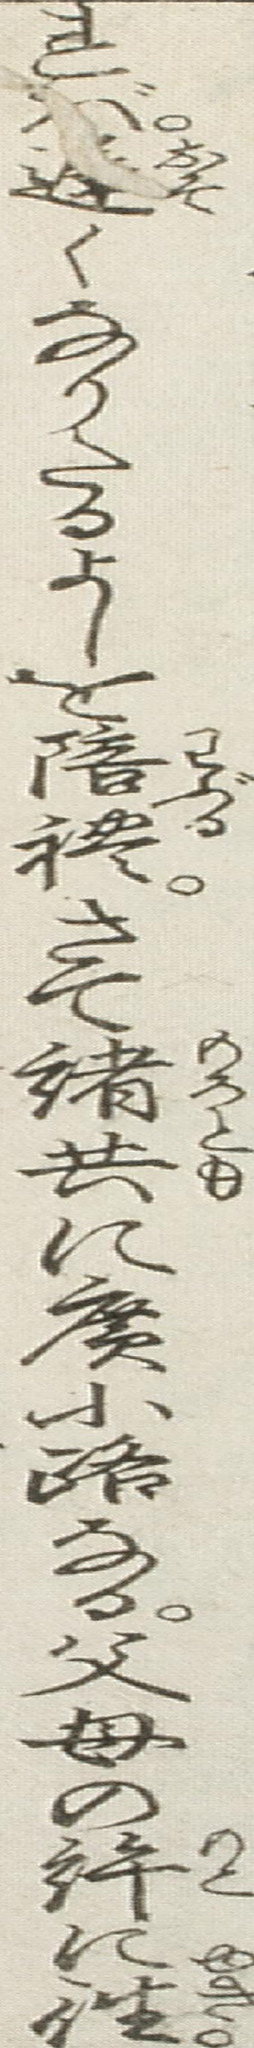れば。遅くなりたるよしを陪礼。さて諸共に広小路なる。父母の許に往。
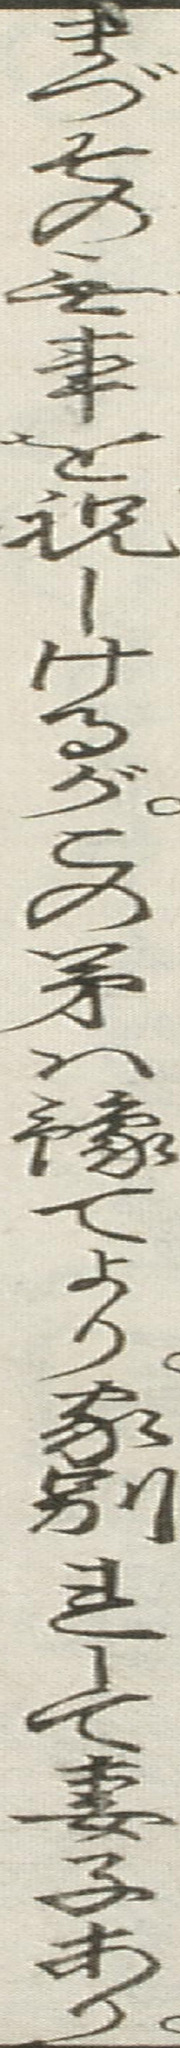まづその無事を祝しけるが。この弟は予てより。家別れして妻子あり。
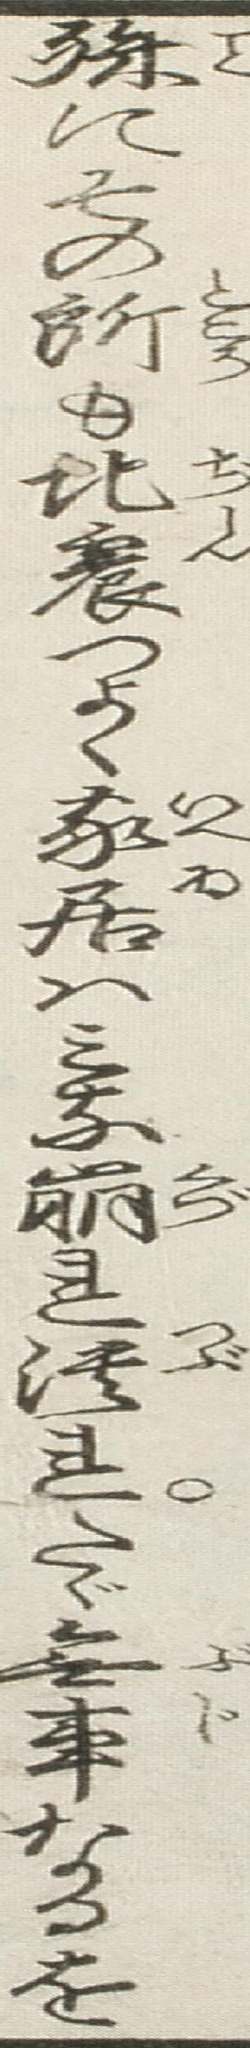殊にその所も地震つよく家居はみな崩れ潰れ。たゞ無事なるを
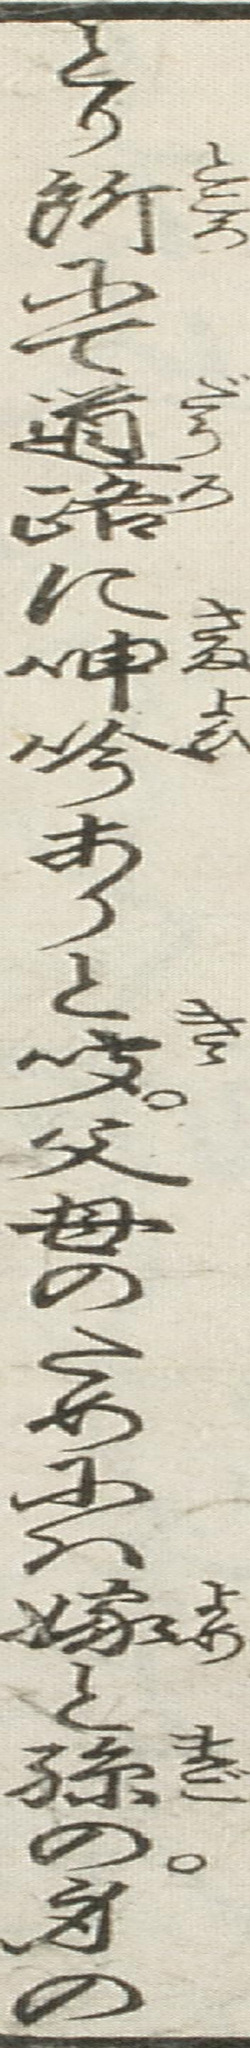とり所にて道路に呻吟ありと聞。父母のためには嫁と孫の。身の
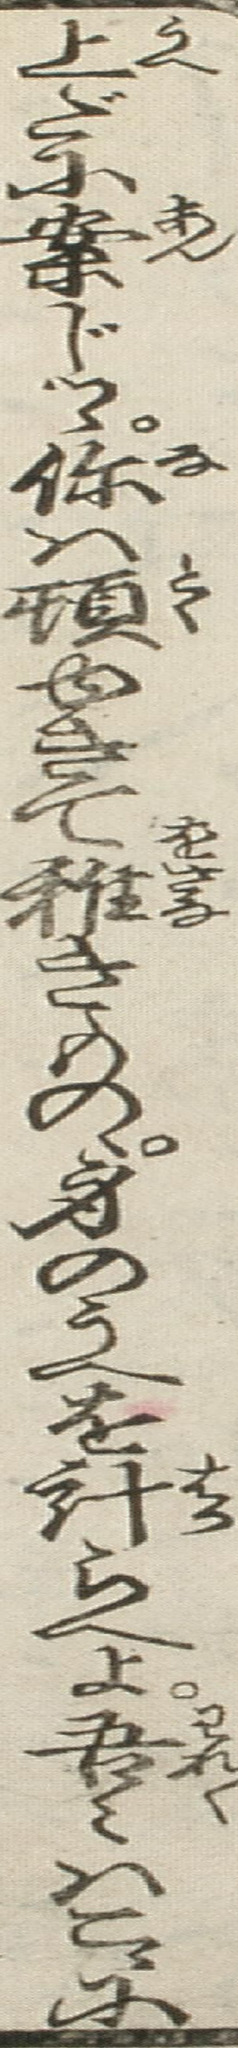上だに案じつゝ。你は頓ゆきて稚きものゝ。身のうへを計らへよ。吾〻はこゝに
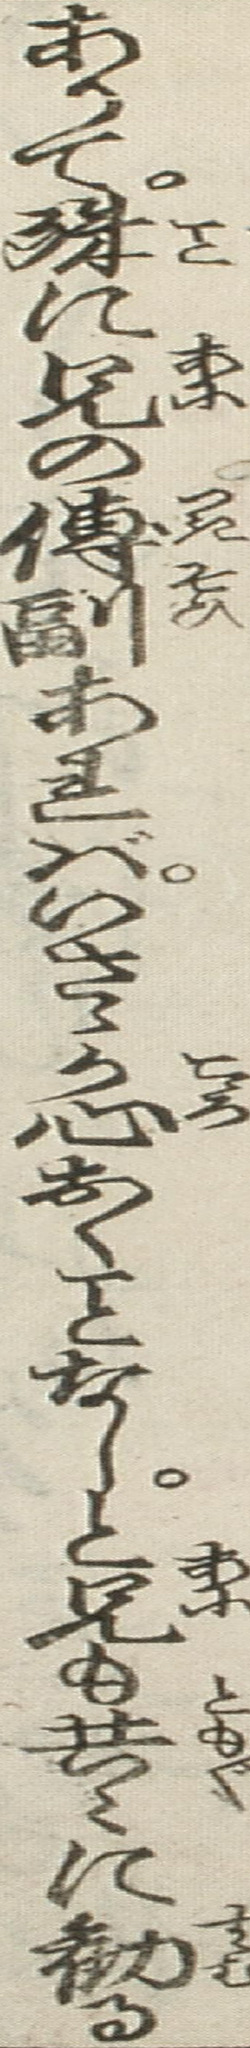ありて、殊に兄の傅副あれば。いさゝか心おくことなし。と兄も共〻に勧る
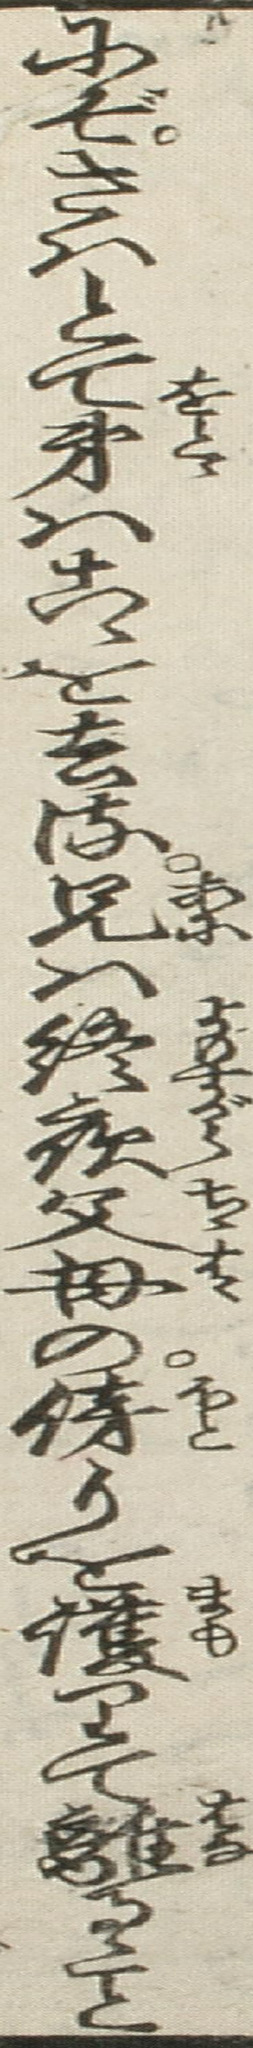にぞ。さはとて弟はこゝを去る。兄は終夜父母の。傍りを護りて離ること
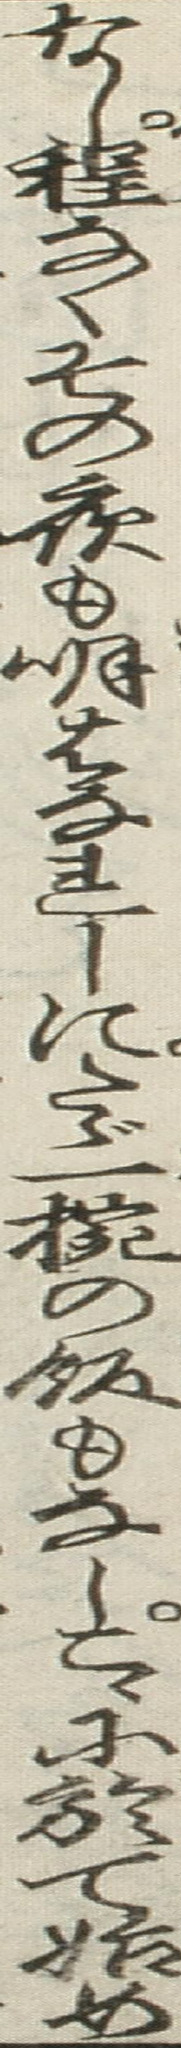なし。程なくその夜も明はなれしに。たゞ一椀の飯もなし。こゝに於て始め
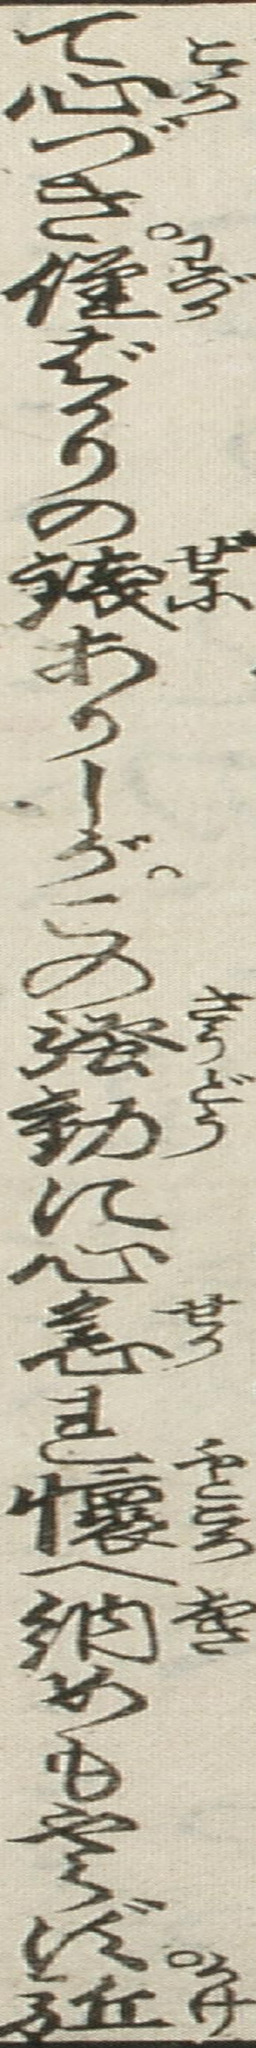て心づき。僅ばかりの銭ありしが。この騒動に心急れ懐へ納めもやらず。駈
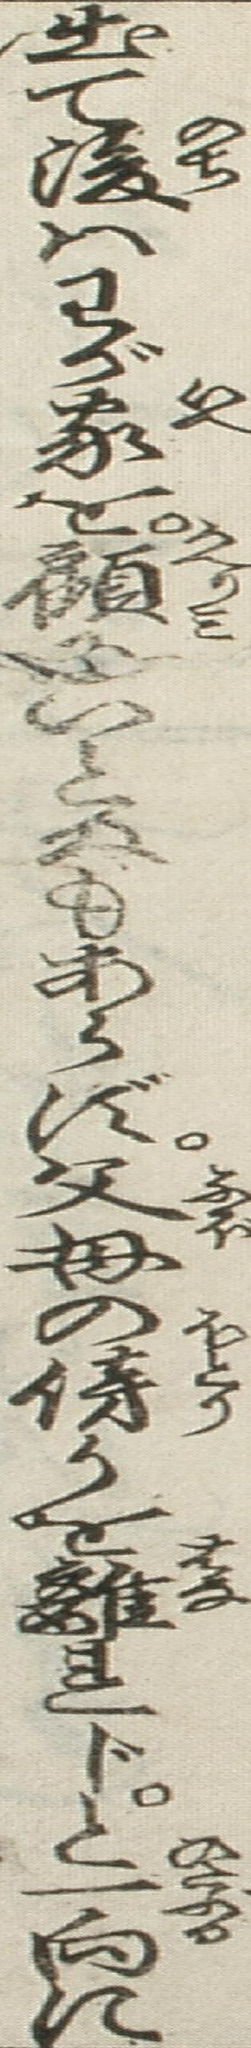出て後はわが家を。顧るいとまもあらず。父母の傍りを離れじ。と一向に
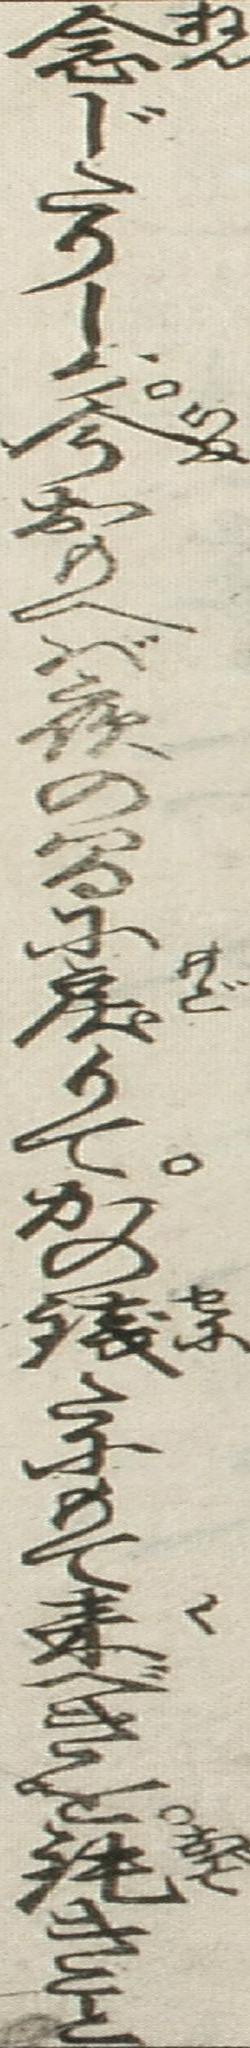念じたりしか。今おもへば夜の間に戻りて。かの銭たにもて来べきを。鈍きこと
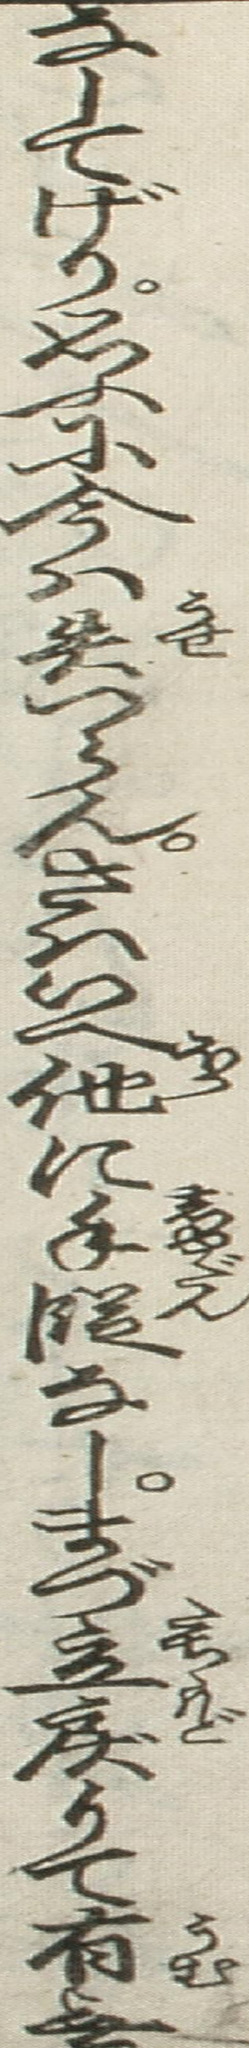なしてげり。思ふに今は失つらん。さはいへ他に手段なし。まづ立戻りて有無
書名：安政見聞録　下
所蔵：東京大学地震研究所図書室 Earthquake Research Institute Library, The University of Tokyo, JAPAN
